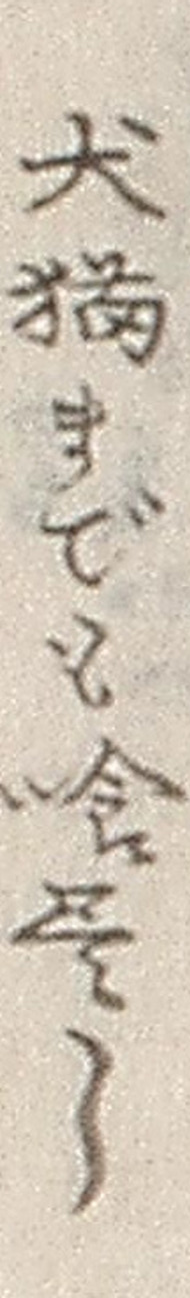犬猫までも喰尽し
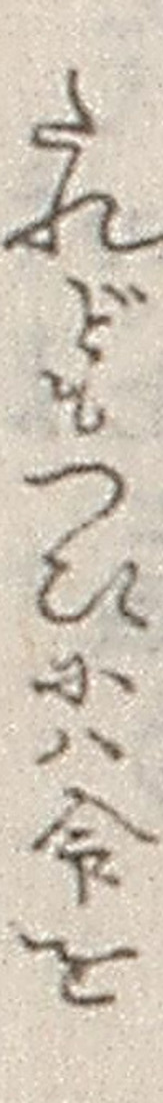たれどもつひには命を
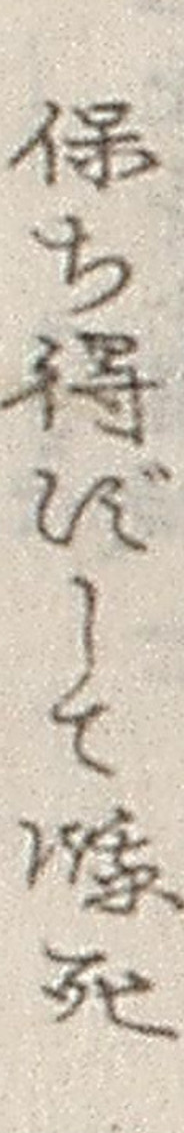保ち得ずして餓死
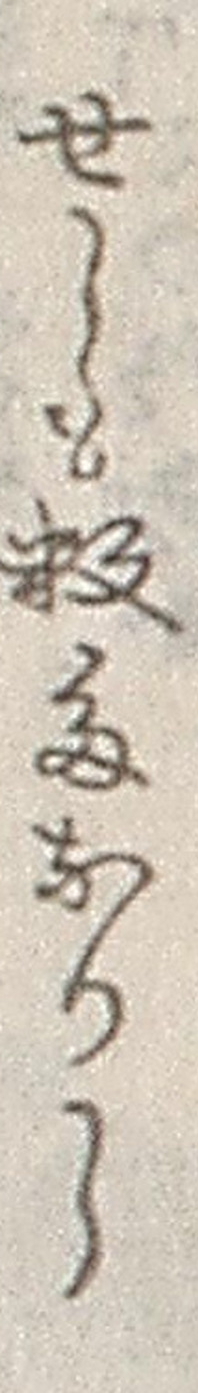せしも数多なりし

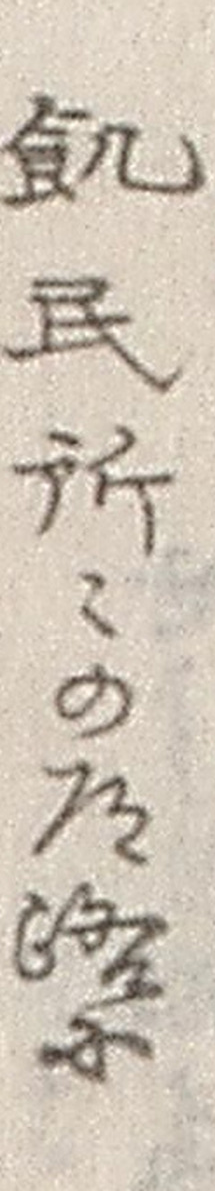飢民所〻の道路に
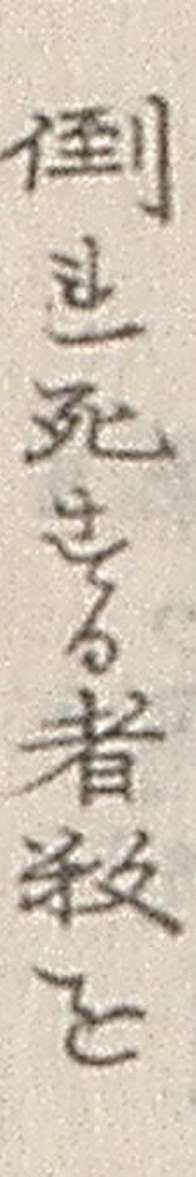倒れ死する者数を
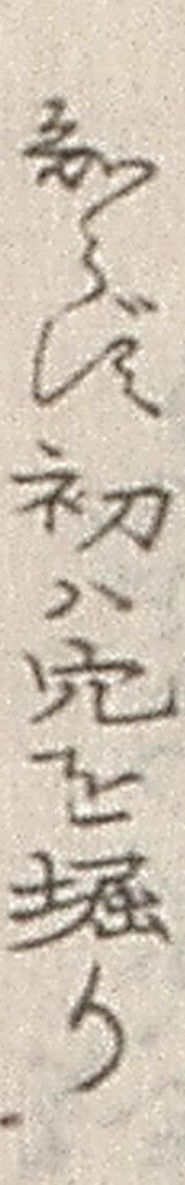知らず初は穴を堀り
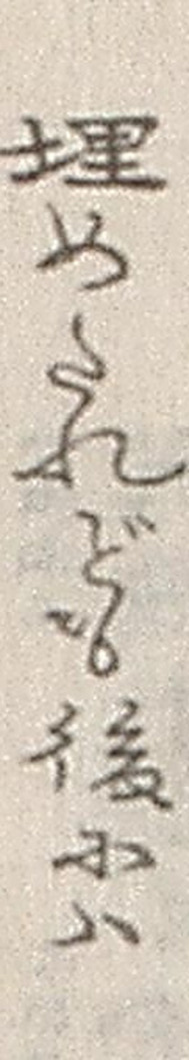埋めたれども後には
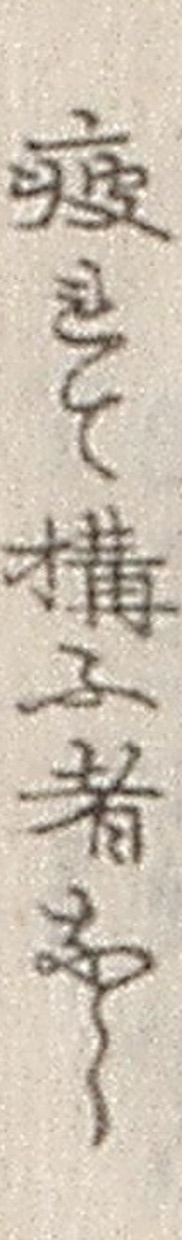疲れて構ふ者なし
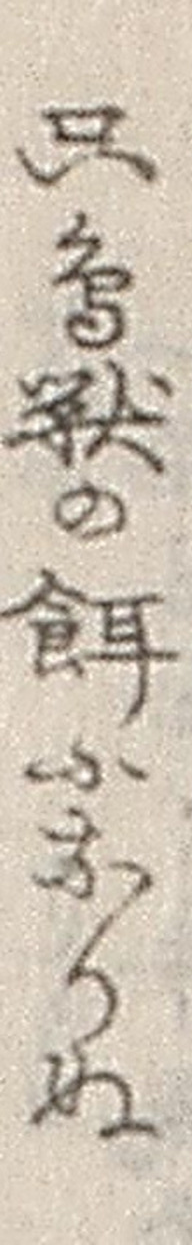只鳥獣の餌になりぬ
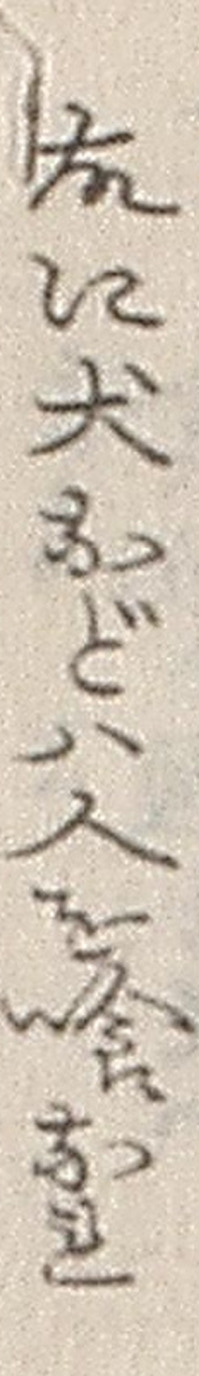故に犬などは人を喰なれ
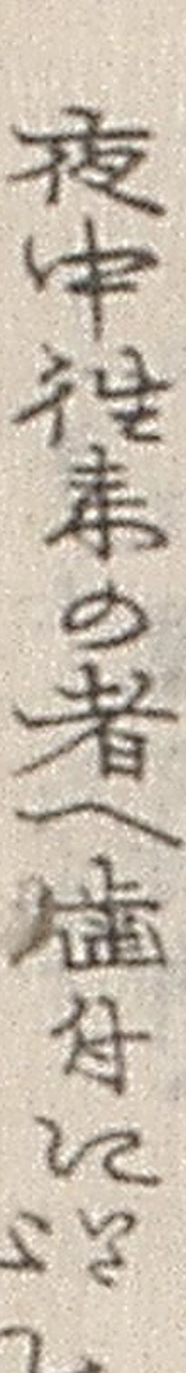夜中往来の者へ歯付に至れり

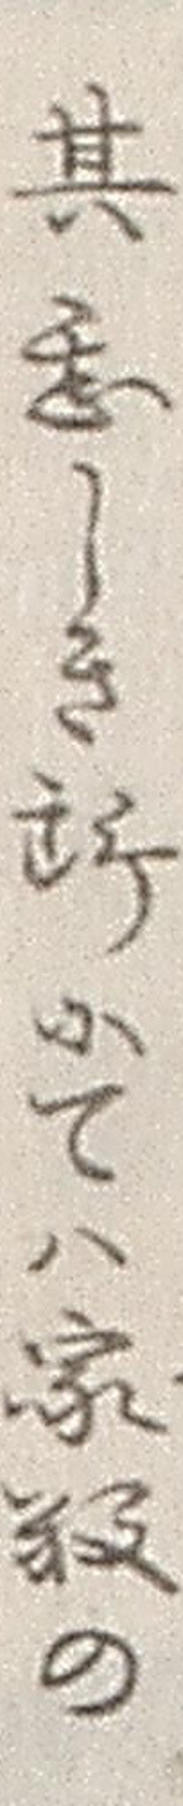其甚しき所にては家数の
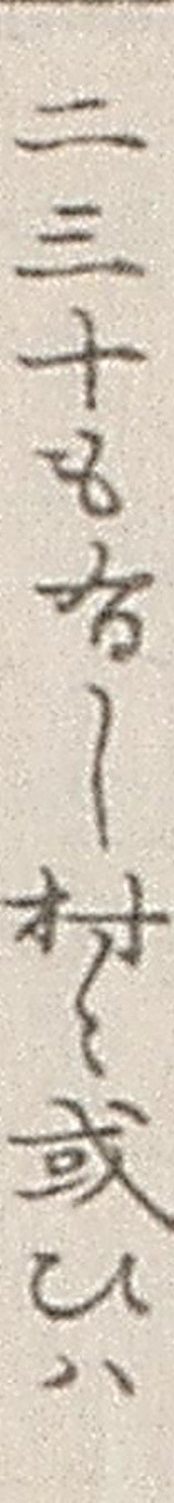二三十も有し村〻或ひは
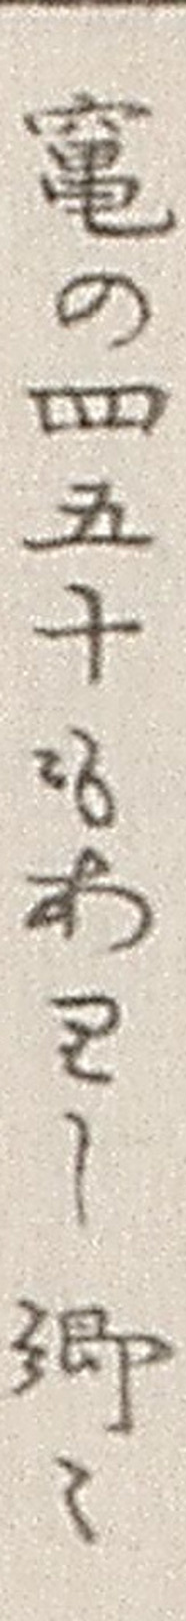竃の四五十もありし郷〻
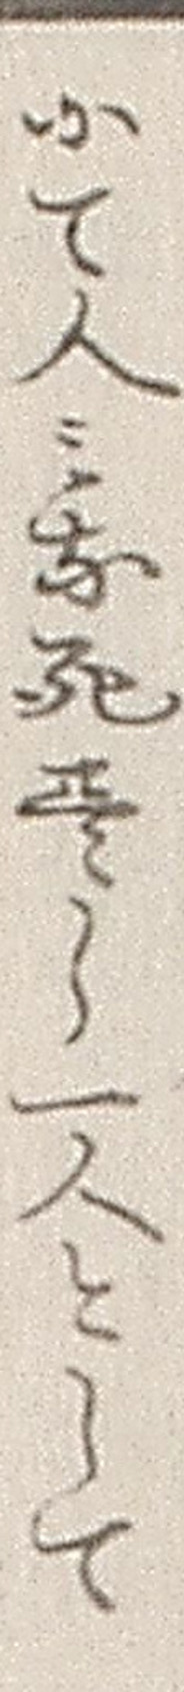にて人みな死尽し一人として
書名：凶荒図録　完
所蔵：東京大学地震研究所図書室 Earthquake Research Institute Library, The University of Tokyo, JAPAN
